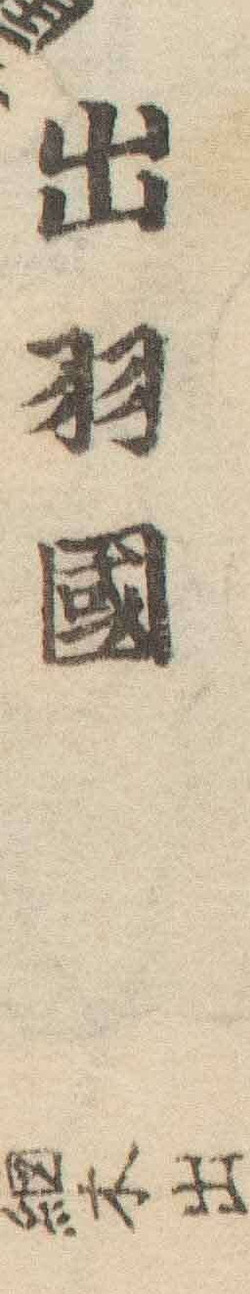出羽国
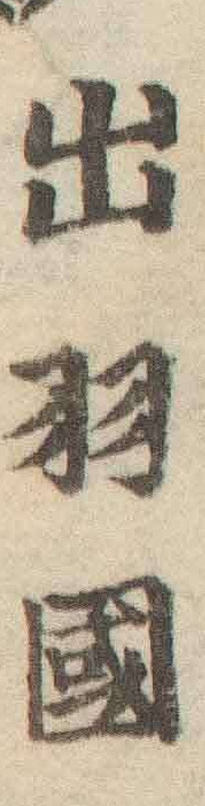出羽国

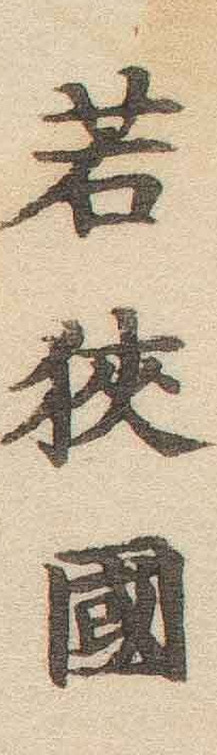若狭国

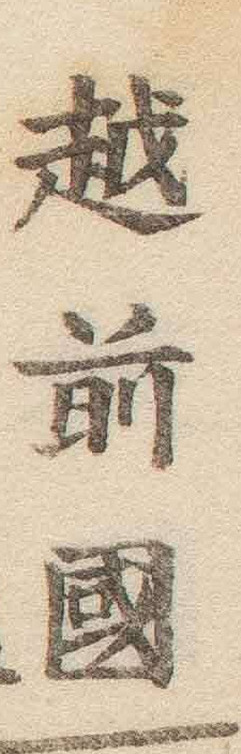越前国

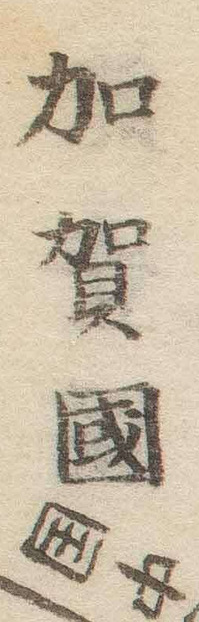加賀国
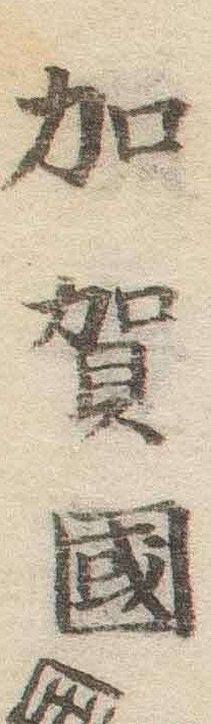加賀国

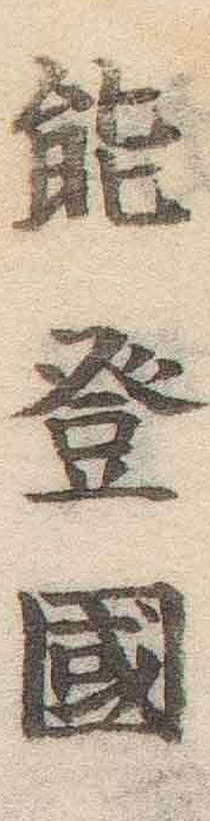能登国

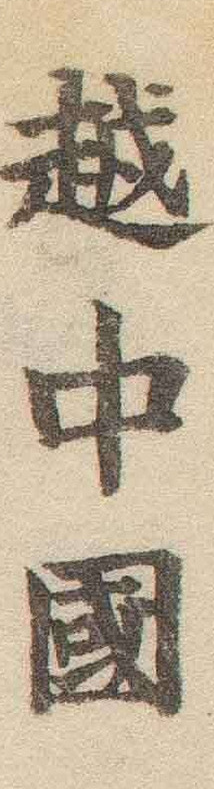越中国

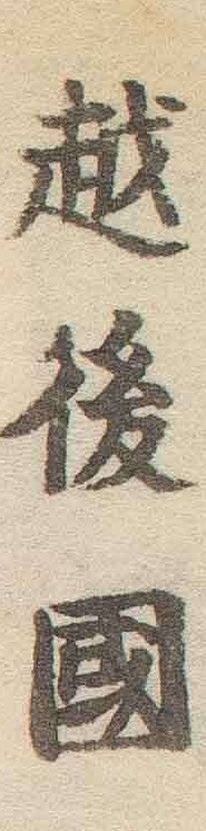越後国
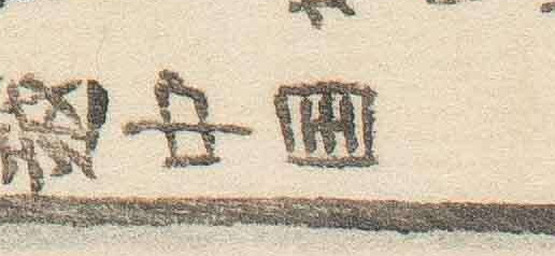越後国
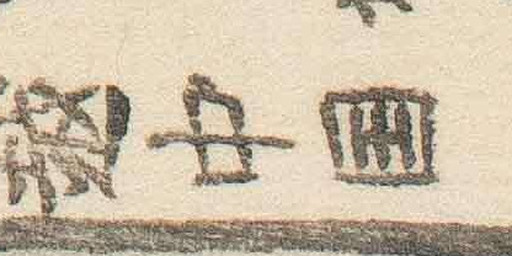越後国

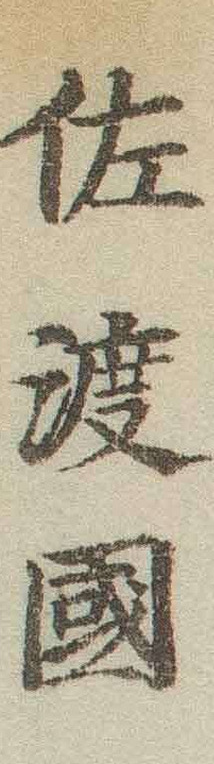佐渡国

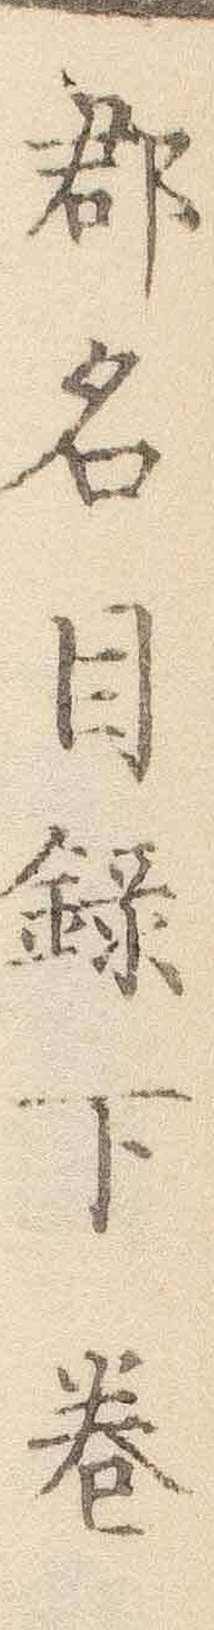郡名目録下巻

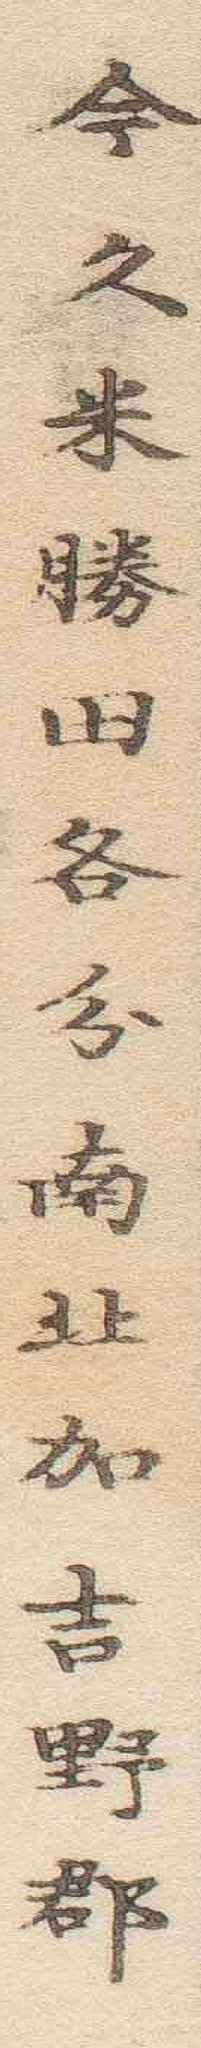今久米勝田各分南北加吉野郡
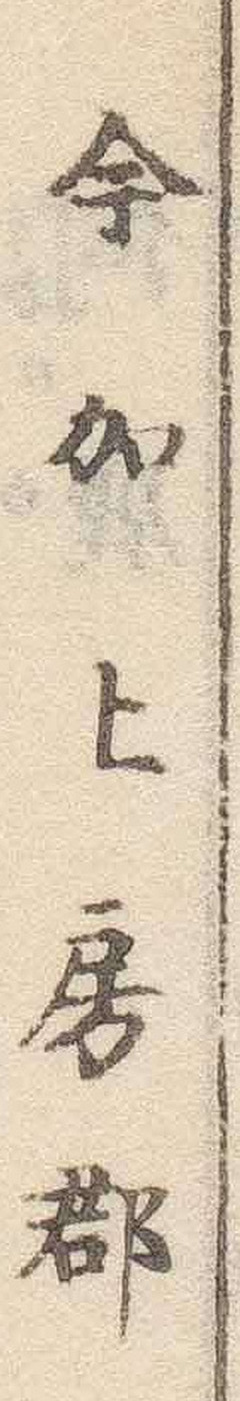今加上房郡
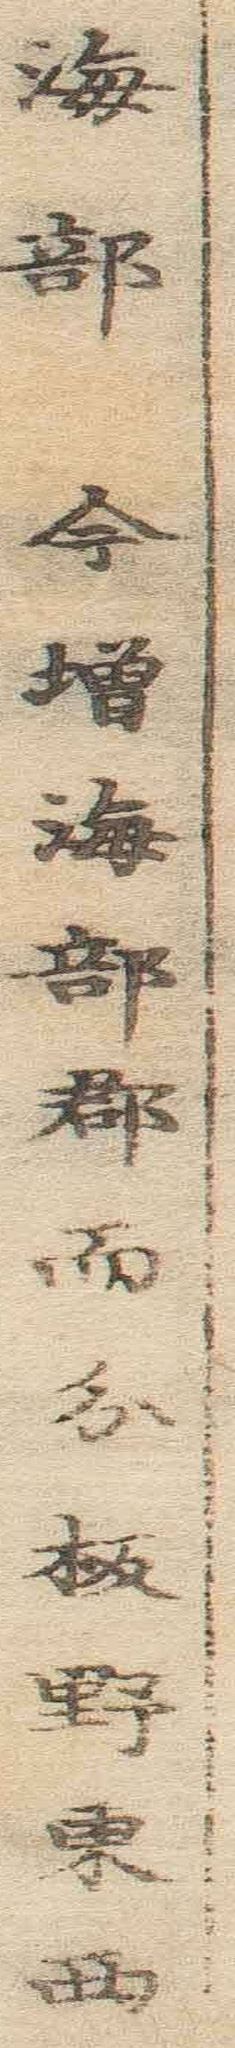海部今増海部郡而分板野東西
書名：国郡全図
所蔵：東京学芸大学附属図書館 国文学研究資料館
